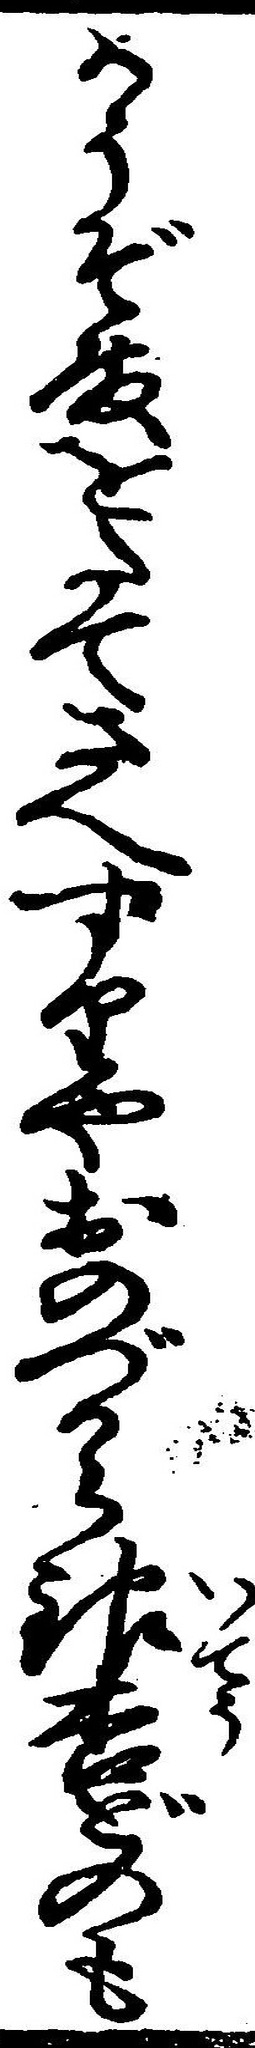かうぞ殿をたてさへすりやおのづから銀杏どのも

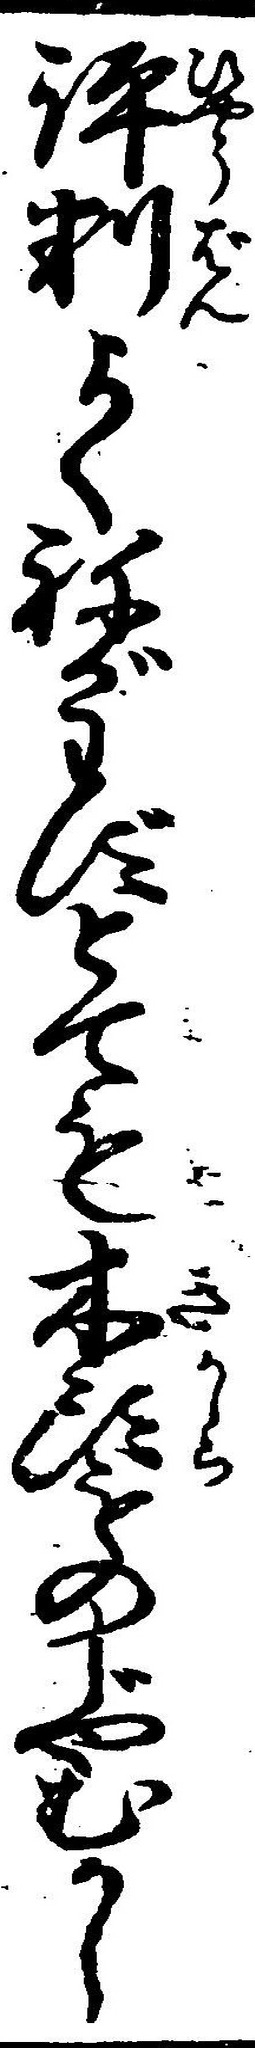評判よくねがわずとても木頭ものじやむかし
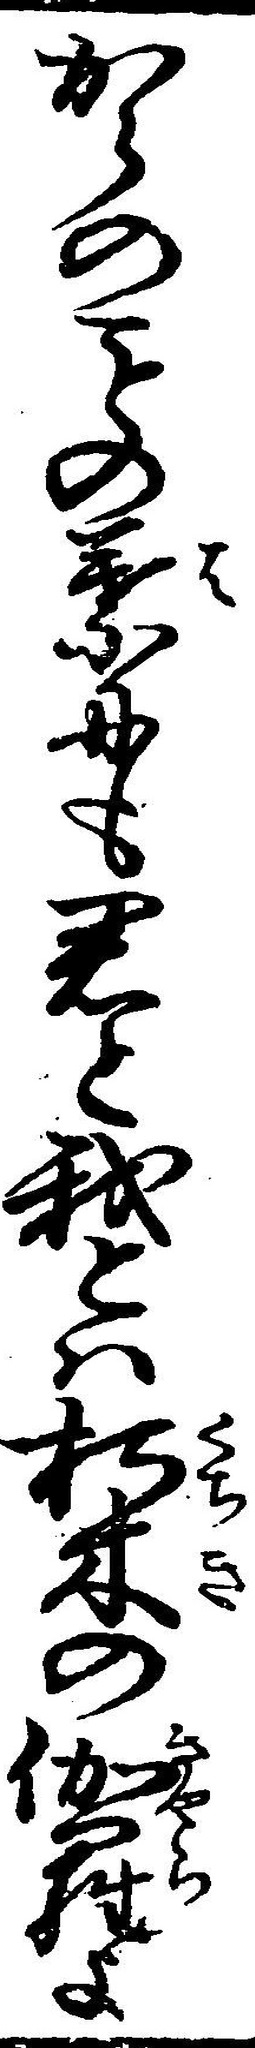からのことの葉にも君と我とは朽木の伽羅よ
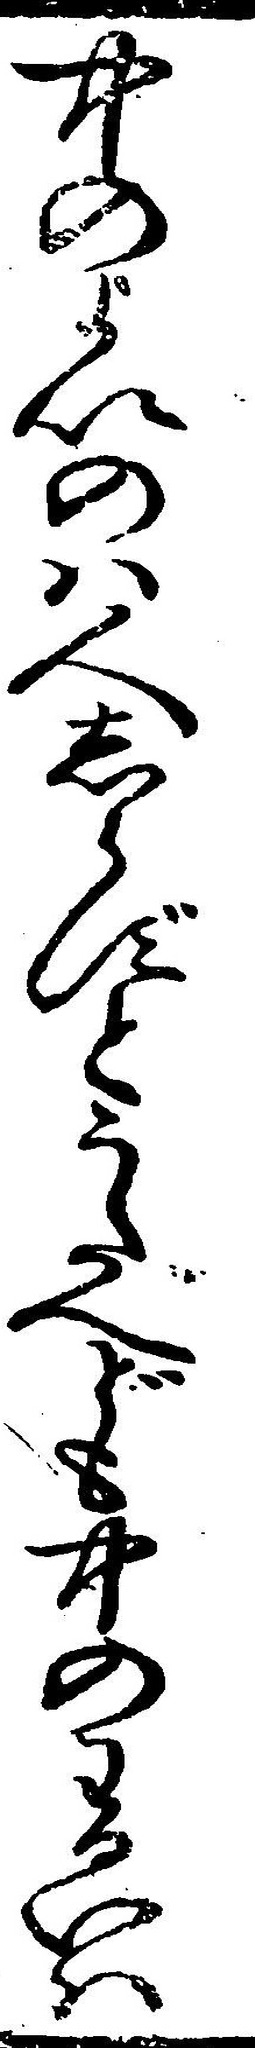中のよいのは人しらずとうたへども中のわるいは
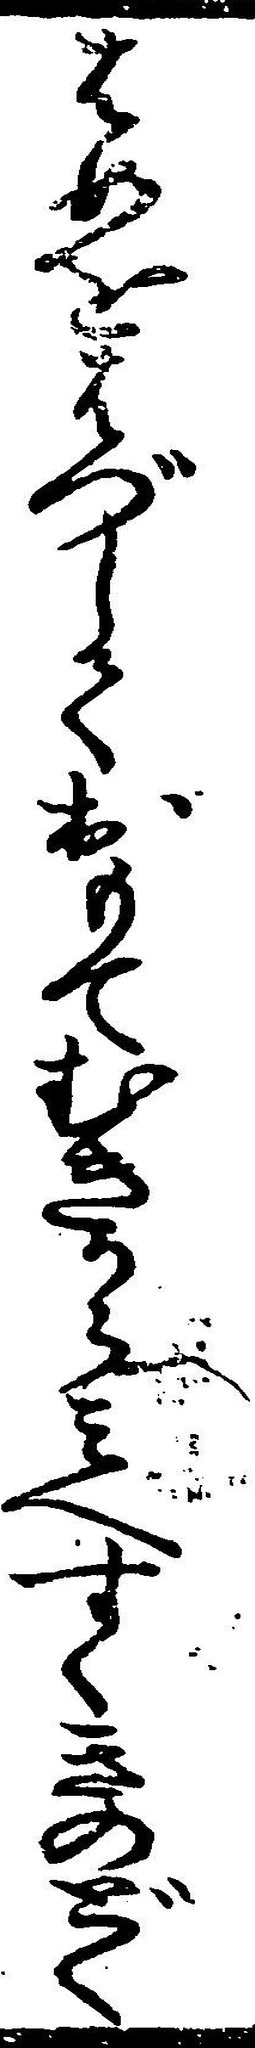はめをはづしておもてむきからみへすゝきのどく
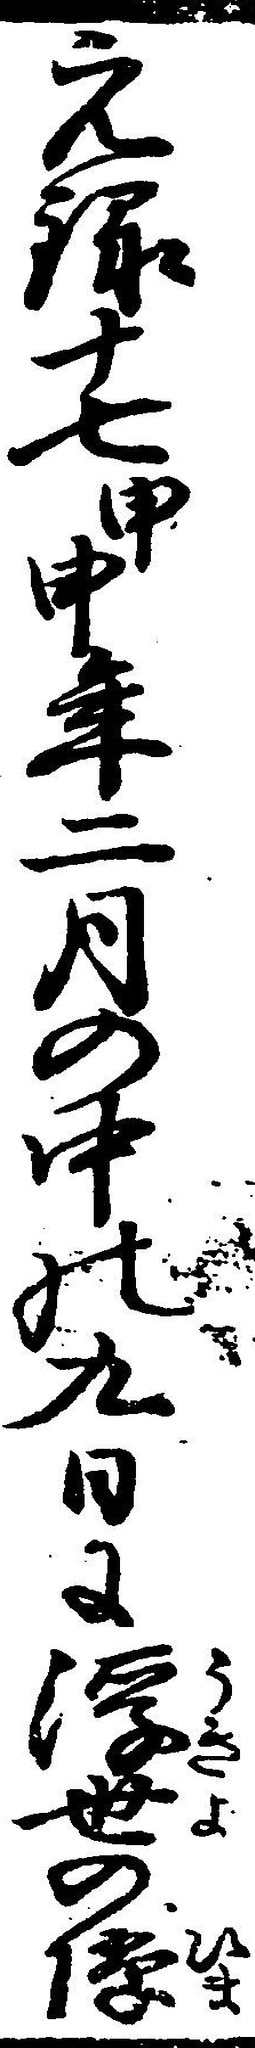元禄十七甲申年二月の中の九日に浮世の隙
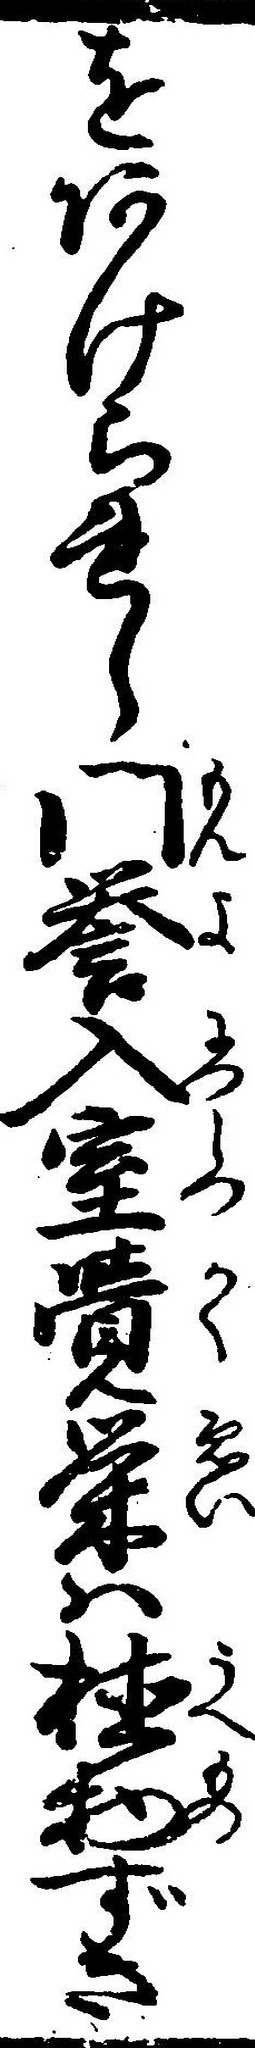をあけられし門誉入室覚栄は植物ずき
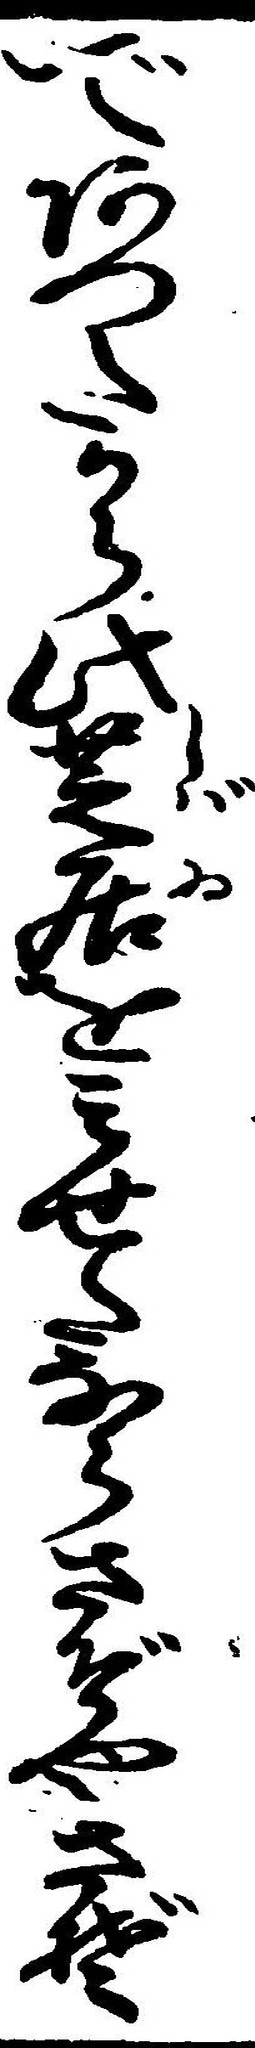であつたから此芝居をみせたならさぞやさぞ
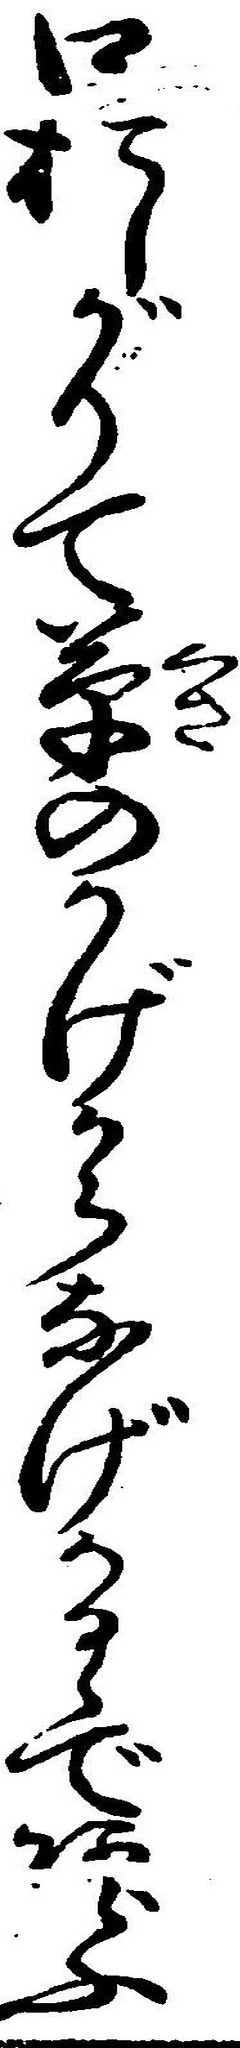口おしがりて草のかげからなげかるゝであらふ
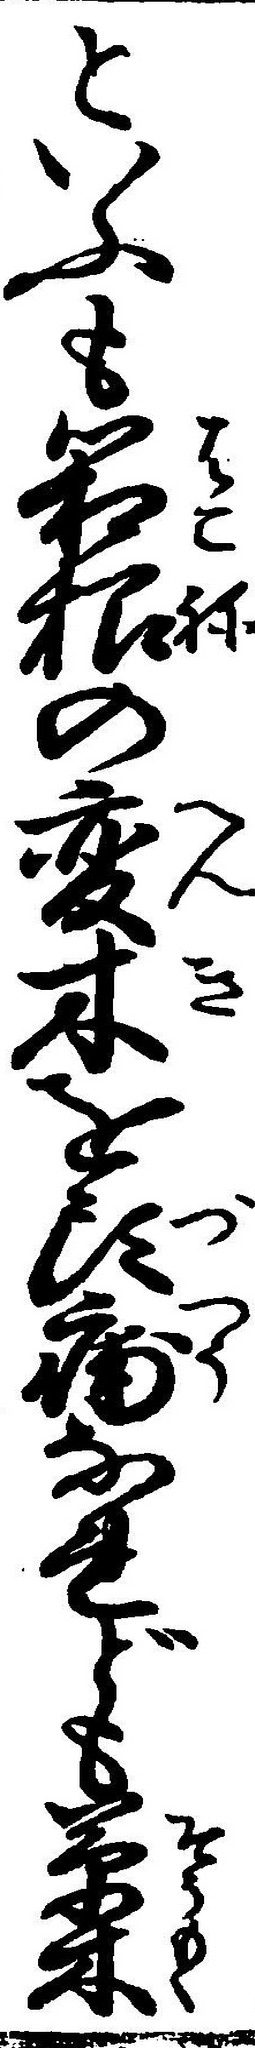といふも箱根の変木を頭痛なれども草木
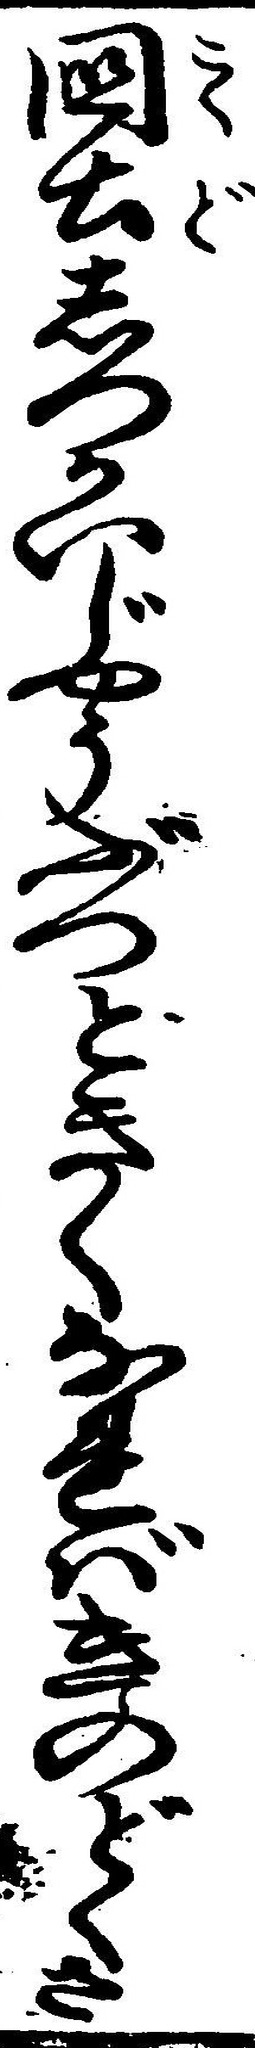国土しつかいじやうぶつときくなればきのどくさ
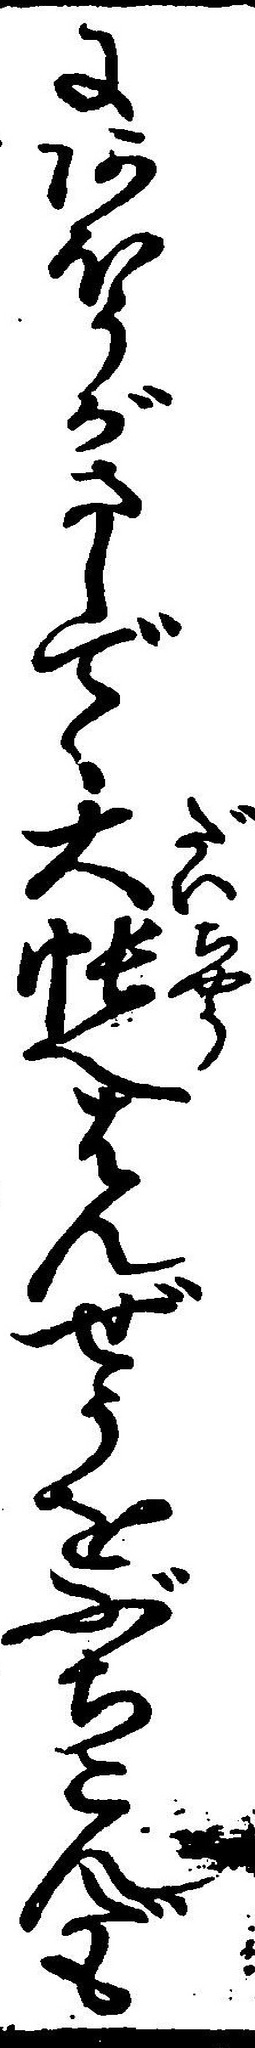にあほうがさしでて大帳へはんぜうをぶちこんだも
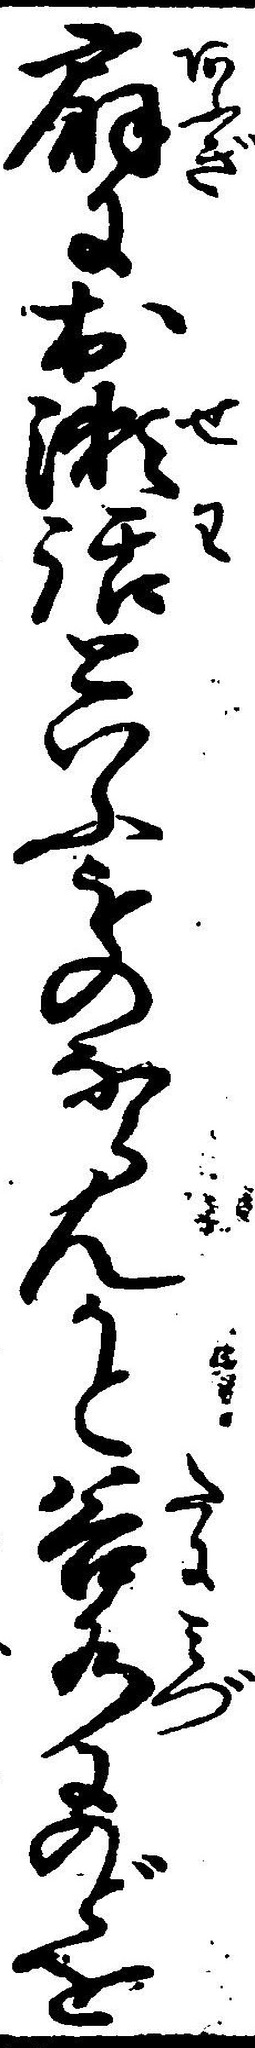扇にお瀬話といふものならんかと谷水にのどを
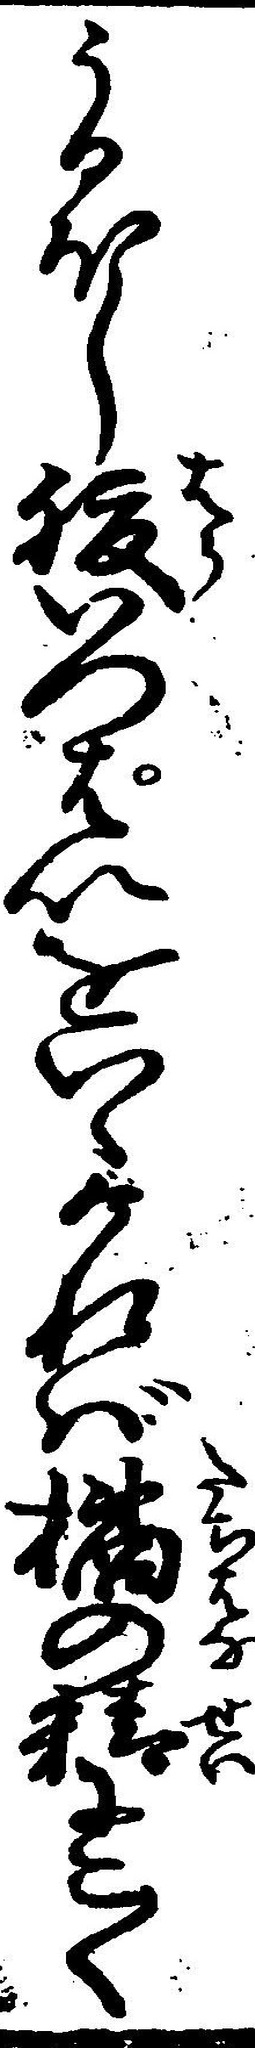うるほし腹いつぱいをいゝければ橘の精にとく
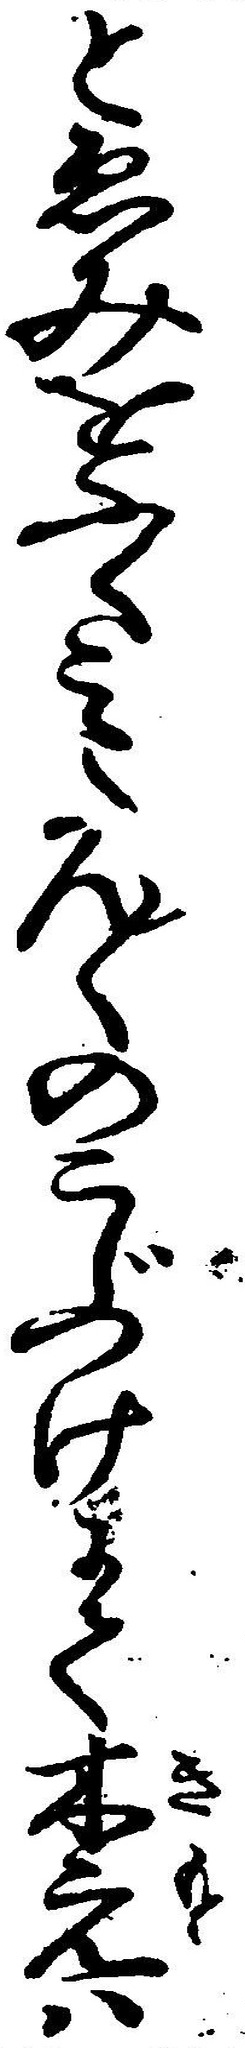とゑみをふくみたん〳〵のこじつけまて木元は

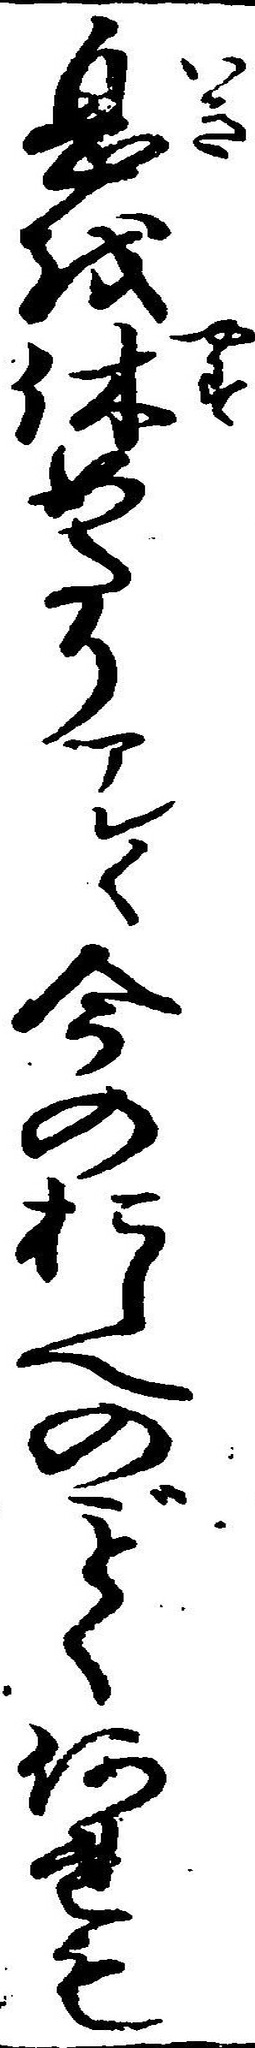息を休めたりアレ〳〵今のおしへのごとくあれも
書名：草木芝居化物退治 / 泉花堂三蝶(十六兵衛)作
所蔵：東京大学総合図書館 General Library in the University of Tokyo, JAPAN
